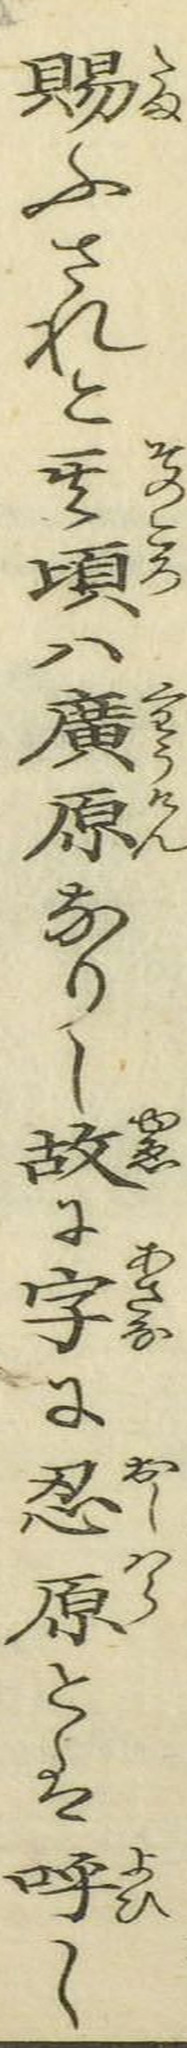賜ふされと其頃は広原なりし故に字の忍原とは呼し
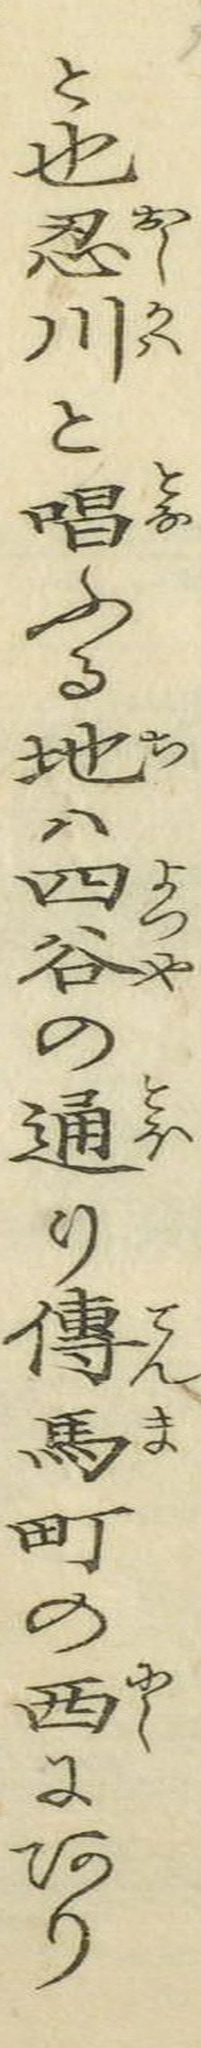と也忍川と唱ふる地は四谷の通り伝馬町の西にあり
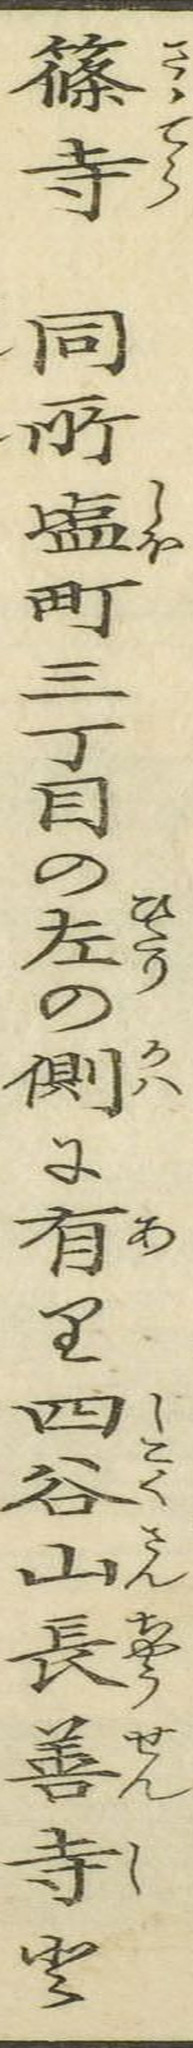篠寺同所塩町三丁目の左の側に有り四谷山長善寺と
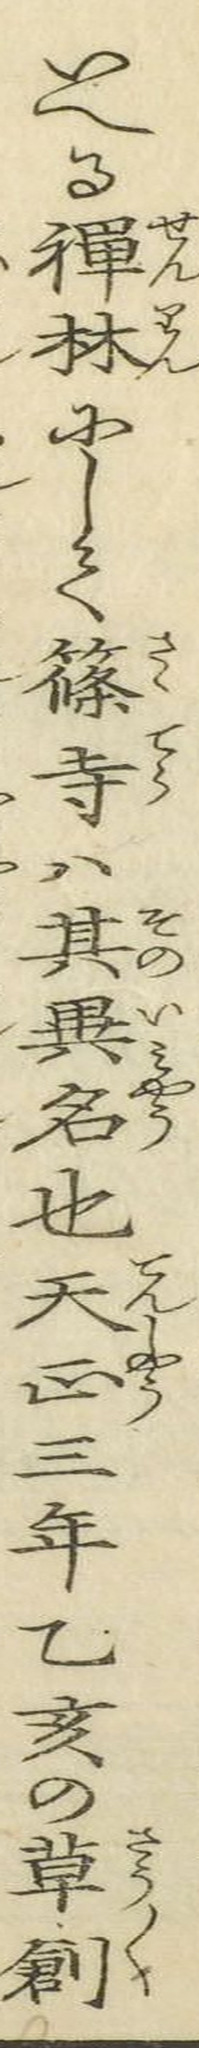いへる禅林にして篠寺は其異名也天正三年乙亥の草創
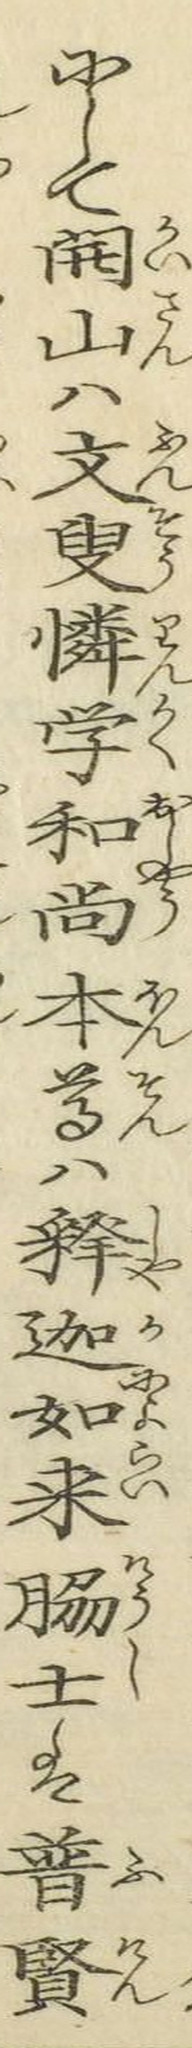にして開山は文叟憐学和尚本尊は釈迦如来脇士は普賢
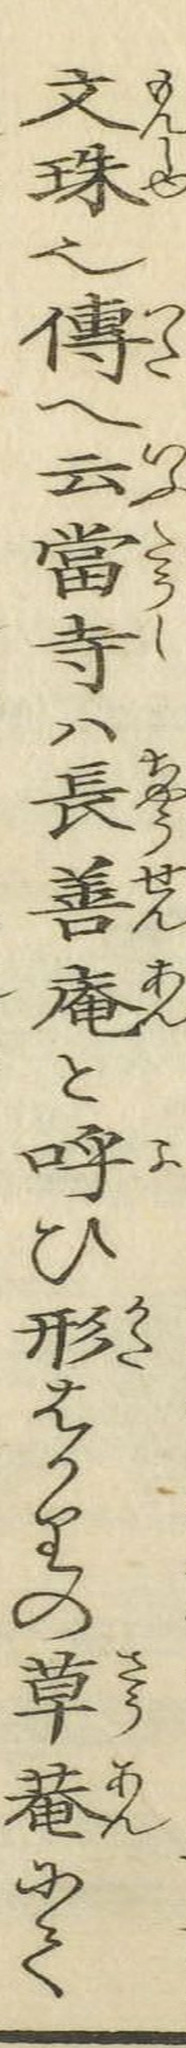文珠也傳へ云当寺は長善庵と呼ひ形はかりの草菴にて
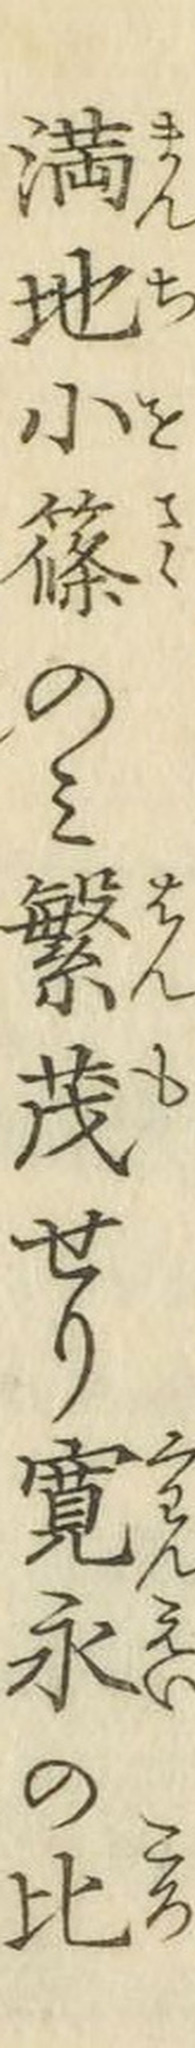満地小篠のみ繁茂せり寛永の比
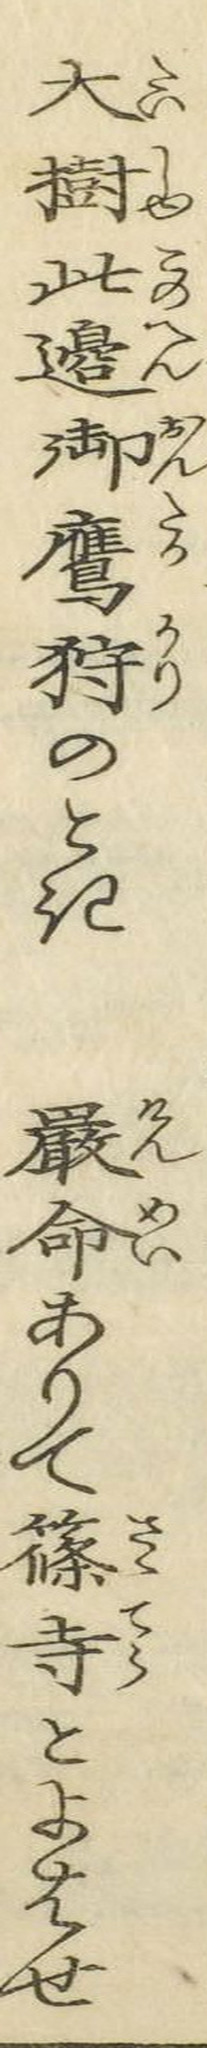大樹此辺御鷹狩のとき厳命ありて篠寺とよはせ
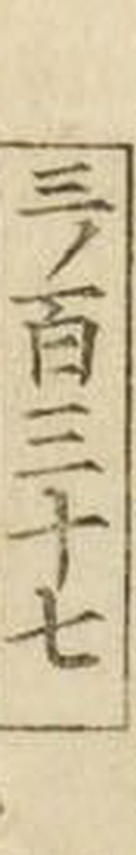三ノ百三十七
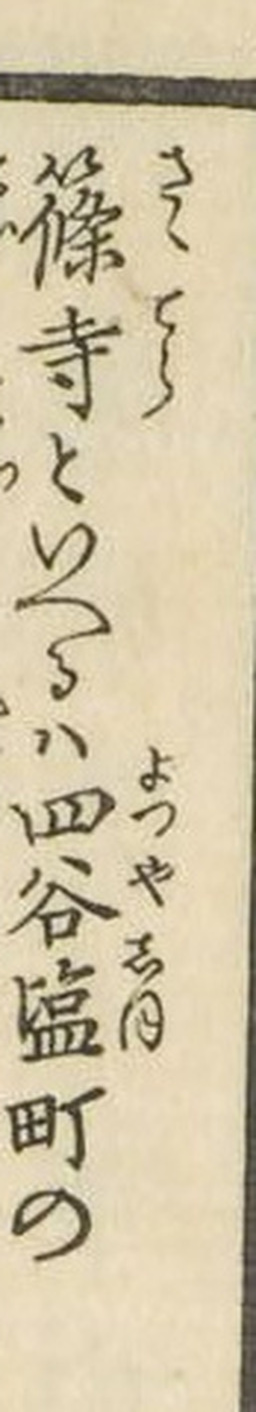篠寺といへるは四谷塩町の
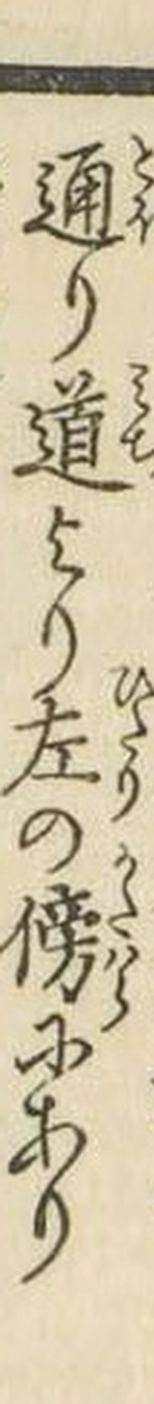通り道より左の傍にあり
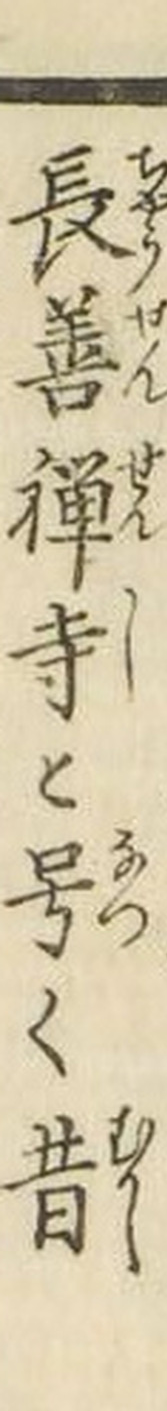長善禅寺と号く昔
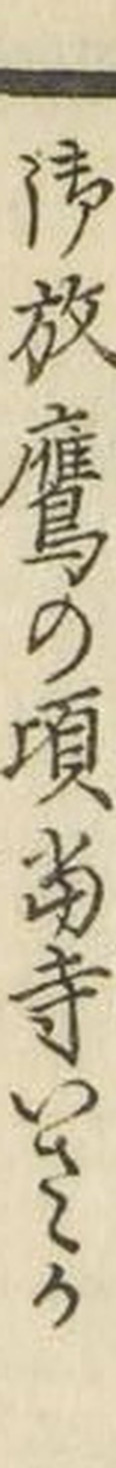御放鷹の頃当寺いさゝか
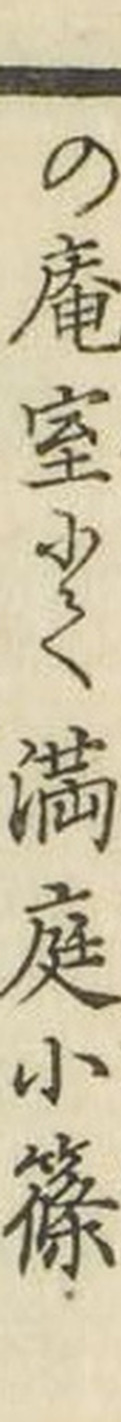の庵室にて満庭小篠
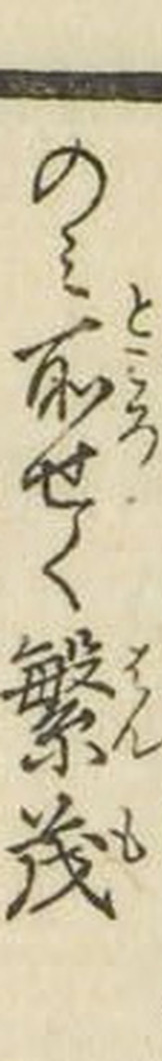のみ所せく繁茂
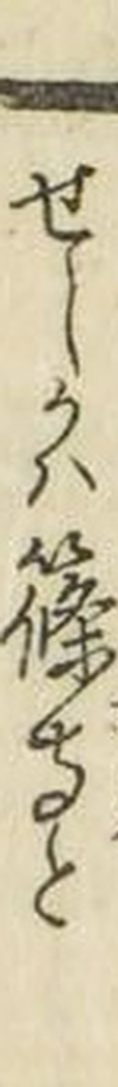せしかは篠寺と
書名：江戸名所図会 20巻 巻之9
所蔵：東京学芸大学教育コンテンツアーカイブ
